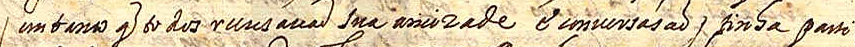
(em tanto q̄ todos recusauão sua amizade e conuersasão) tinha parti
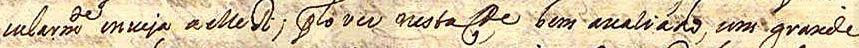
cularmte enueja a elle R; p̄lo ver nesta Cde bem aualiado, com grande
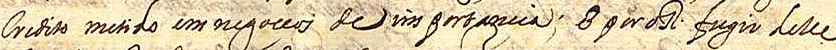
Credito metido em negoçios de importançia; e por o R. fugir delle
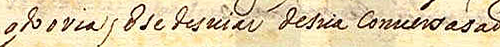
qdo o via, e se desuiar de sua conuersasão
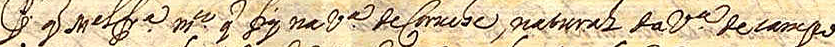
P q̄ Mel fra. mor. q̄ foy na Va. de Coruche, naturaL da Va. de campo
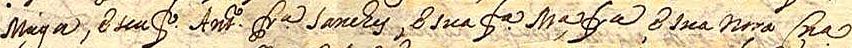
Mayor, e seu fo. Anto. fra. Sanches, e sua fa. Ma fra, e sua nora Cna.
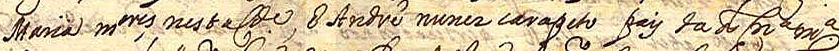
Maria mores nesta Cde., e Andrē nunez carapeto pay da d̄ Cna ma
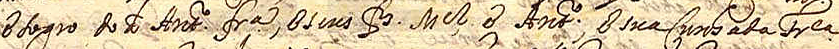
e Sogro do d̄ Anto. fra., e seus fos. Mel e Anto., e sua Cunhada Frca.
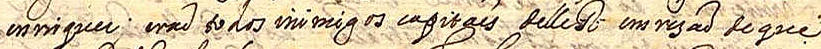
enrriquez; eraõ todos inimigos capitaēs delle R em rezaõ de que
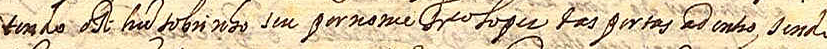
tendo o R. hū sobrinho seu por nome Frco Lopez das portas adentro, sendo
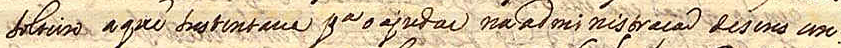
Solteiro a quē sustentaua pa o ajudar na administraçaõ de seus con
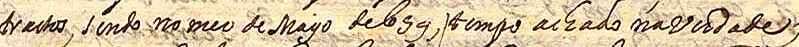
tractos, sendo no mez de Mayo de 659, (tempo achado na verdade)
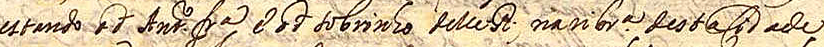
estando o d̄ Anto. fra e o d̄ sobrinho delle R. na ribra. desta CIdade
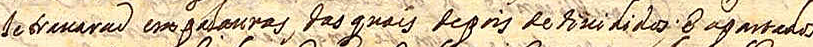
se trauaraõ em palauras, das quais depois de diuididos; e apartados
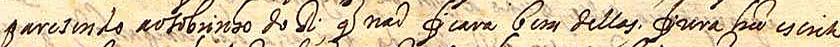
paresendo ao sobrinho do R. q̄ naõ ficara bem dellas fizera hū escrito
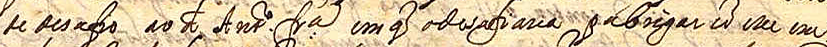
de desafio ao d̄ Anto. fra. em q̄ o desafiaua pa brigar cō elle em
